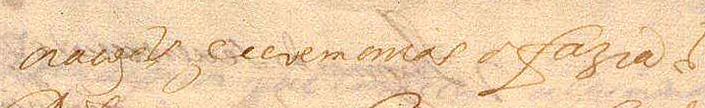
oraçoẽs e ceremonias o fazia?
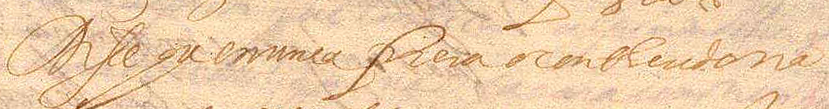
Disse que nunca fizera o contheudo na
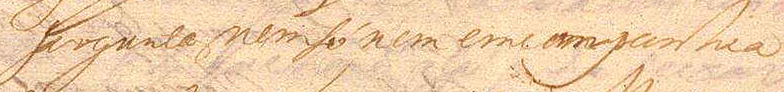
pergunta nem só nem em companhia
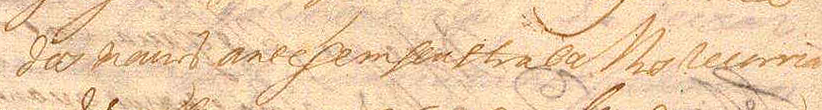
dos mouros antes em seus trabalhos recorria
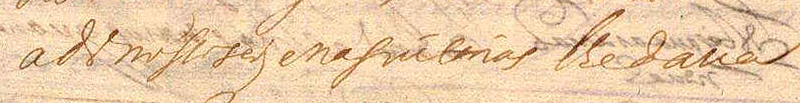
a ds̄ nosso sor e nas uitorias lhe daua
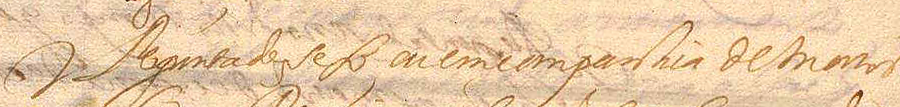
item Perguntado se só, ou em companhia de mouros
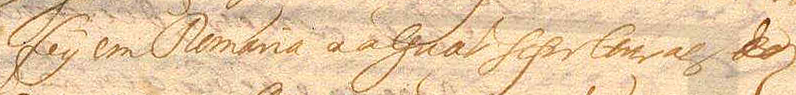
foy em Romaria a alguās sepolturas dos
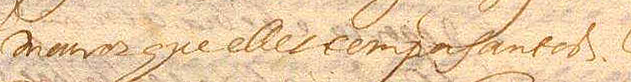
mouros que elles tem por santos?
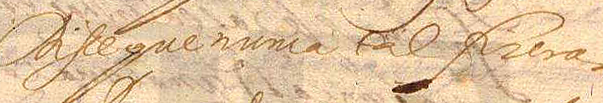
Disse que nunca tal fizera
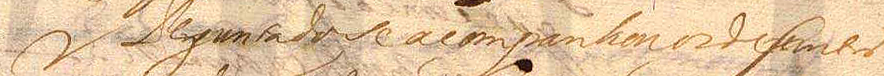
item Perguntado se acompanhou os defuntos
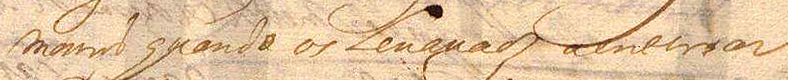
mouros quando os leuauaõ a enterrar
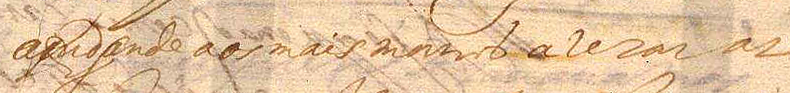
acudindo aos mais mouros a rezar as
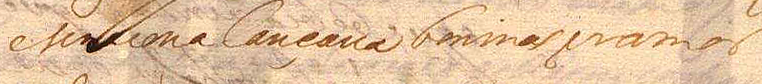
e se na coua lançaua boninas e ramos
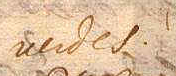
uerdes?
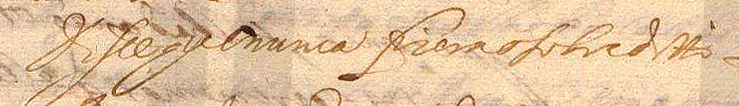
Disse que nunca fizera o sobreditto
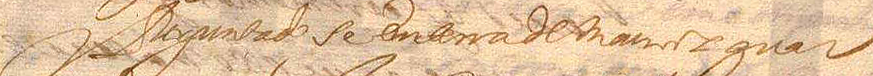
item Perguntado se en terra de mouros guar
